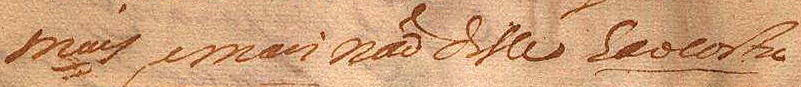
mais, e mais naõ disse E ao costu
